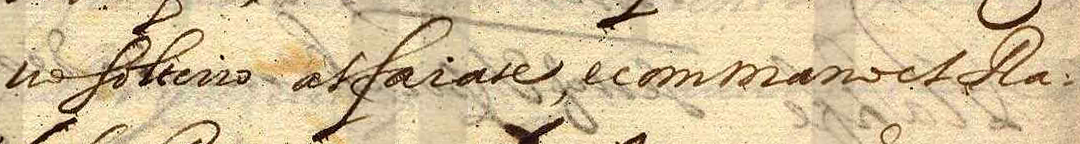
uo solteiro alfaiate, e com manoel Ra
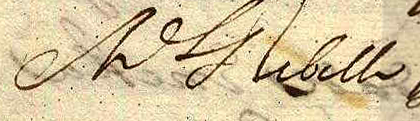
Mel Rebello
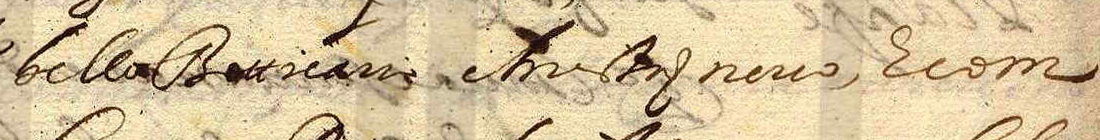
bello Botticario christaõ nouo, E com
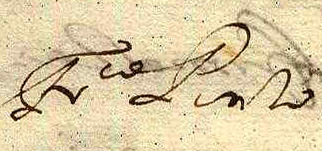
Fr.co Pinto.
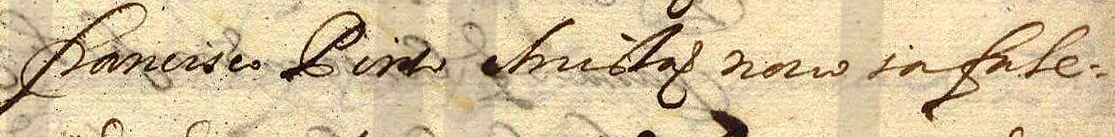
francisco Pinto christaõ nouo ia fale
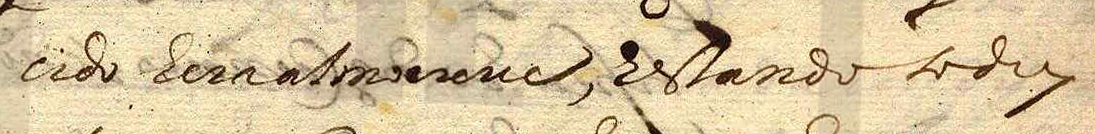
cido E era almocreue, E estando todos
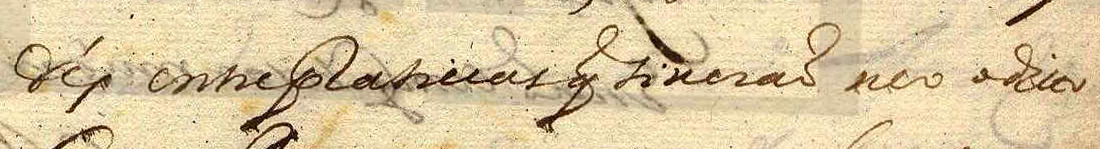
dés entre praticas q̄ tiueraõ ueo o ditto
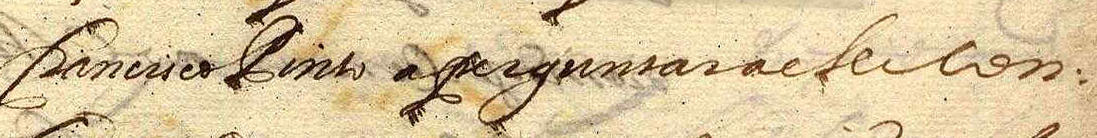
francisco Pinto a perguntar a ele con
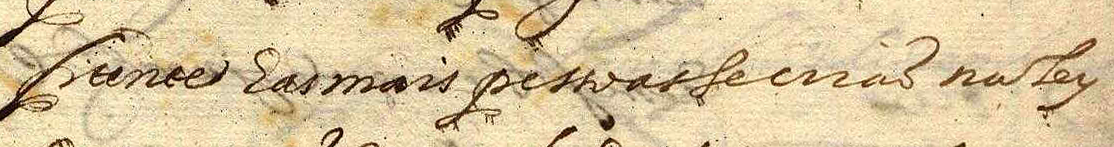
fitente E as mais pessoas se criaõ na ley
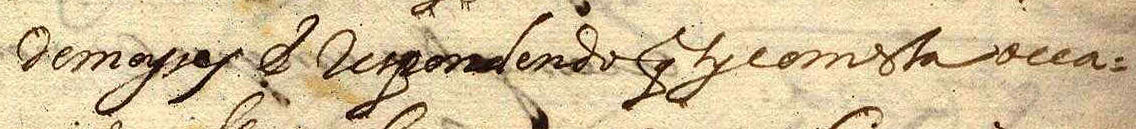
de moyses e Respondendo q̄ sy com esta occa
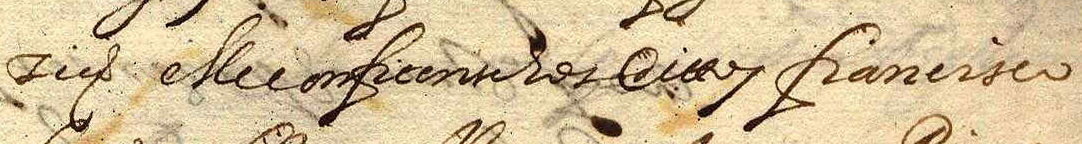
ziaõ elle confitente E os dittos francisco
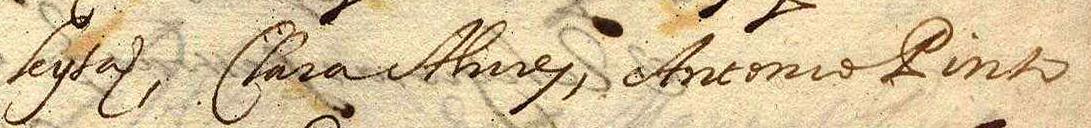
leytaõ, Clara Alures, Antonio Pinto
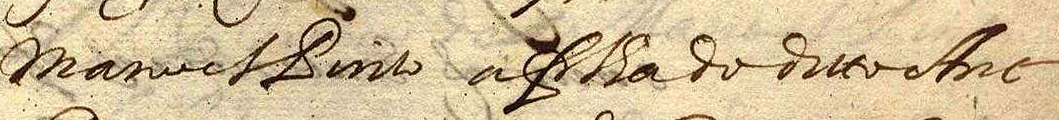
manoel Pinto a filha do ditto Anto
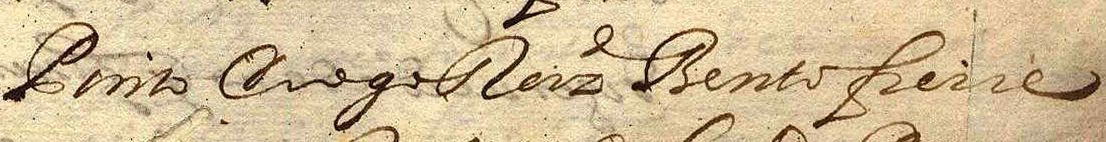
Pinto diogo Roiz̄ Bento freire
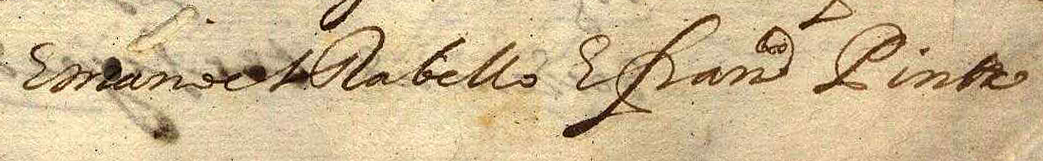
E manoel Rabello E franco Pintto
